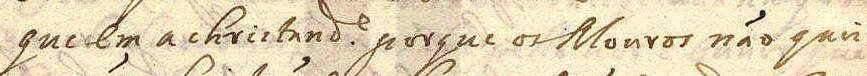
que em a christand.e porque os Mouros naõ quei
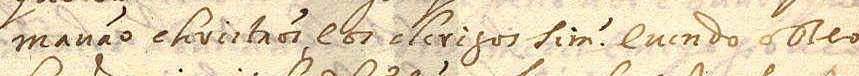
mauaõ christaõs, e os clerigos sim. E uendo o Reo
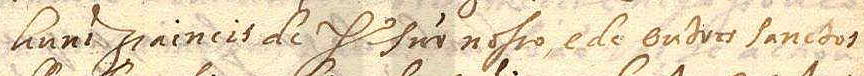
huns paineis de Xo snr̄ nosso, e de outros sanctos
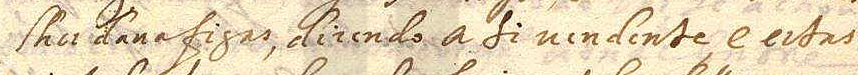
lhes daua figas, dizendo a ti uendente, e estas
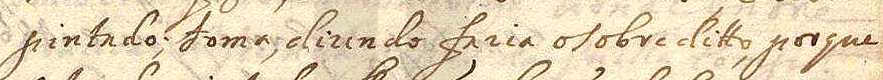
pintado; toma, dizendo fazia o sobreditto, porque
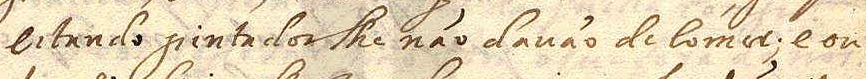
estando pintados lhe naõ dauaõ de comer, e ou
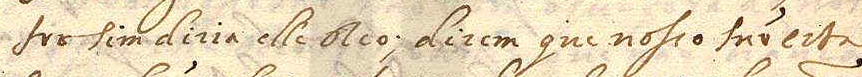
trosim dizia elle Reo; dizem que nosso snr̄ esta
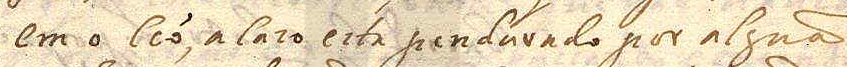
em o Ceó, acazo esta pendurado por alguā
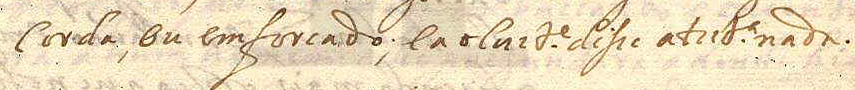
corda, ou enforcado, e ao Cust.e disse a test.a nada.
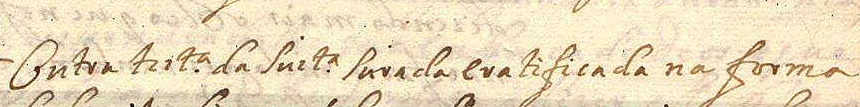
Outra test.a da Iust.a Iurada e ratificada na forma
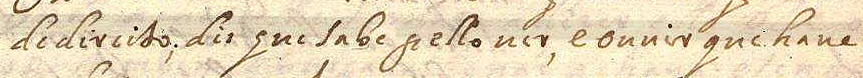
de direito; dis que sabe pello uer, e ouuir que haue
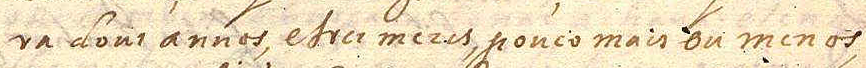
ra dous annos, e tres mezes, pouco mais ou menos,
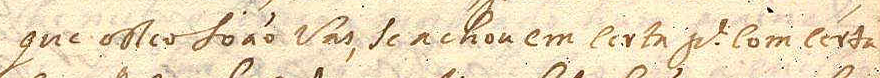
que o Reo Ioaõ Vas, se achou em certa p.e com certa
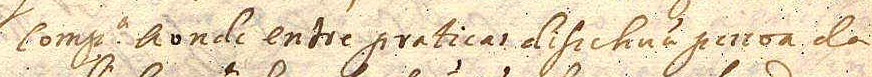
comp.a aonde entre praticas disse huā pessoa da
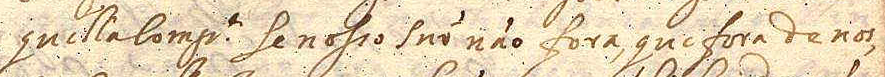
quella Comp.a se nosso snr̄ naõ fora, que fora de nos,
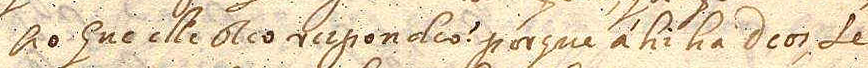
ao que elle Reo respondeo. porque ahi ha Deos, se
